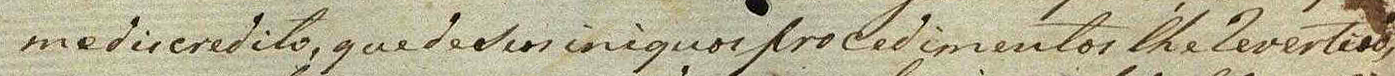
me discredito, que de seos iniquos procedimentos lhe Revertiao,
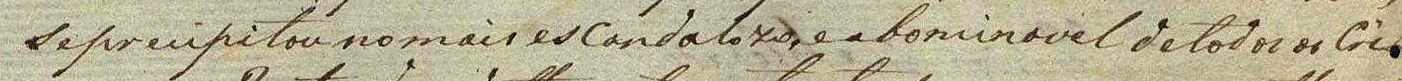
se precipitou no mais escandalozo, e abominavel de todos os Cri
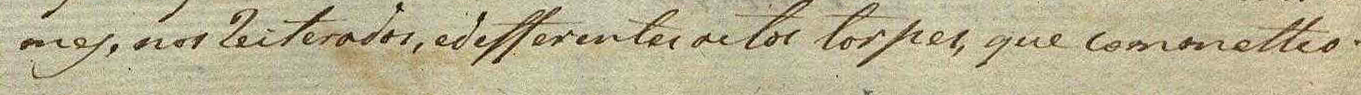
mes, nos Reiterados, e defferentes actos torpes, que commetteo
